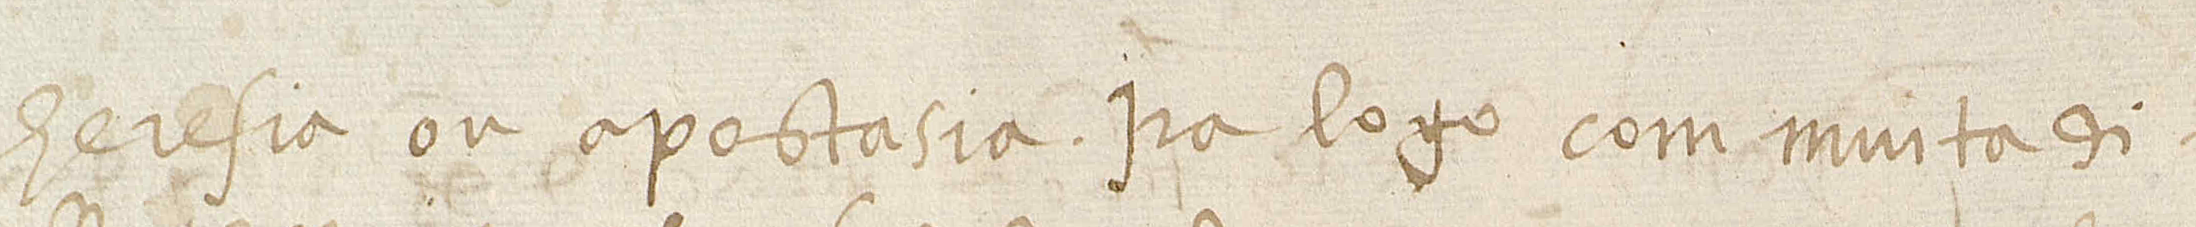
heresia ou apostasia. Jra logo com muita di
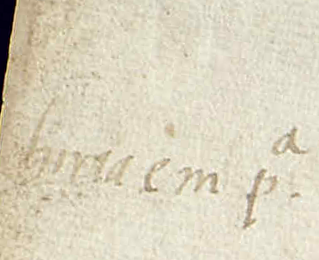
hiria em p.a
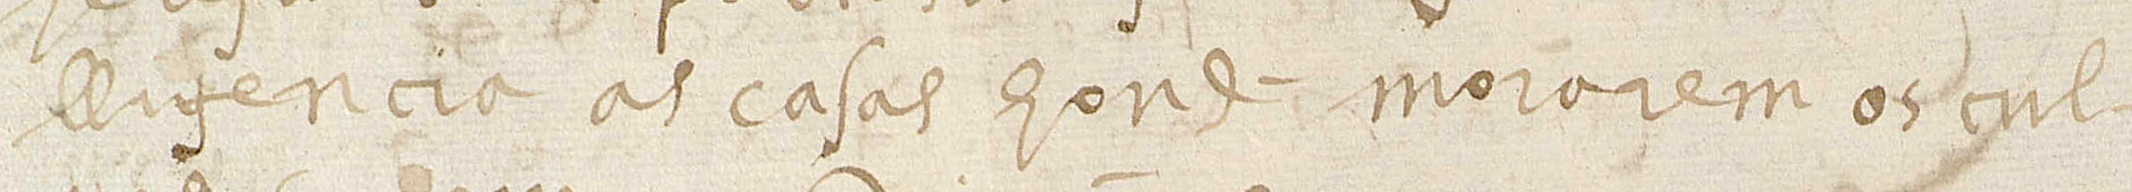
lligencia as casas honde morarem os cul
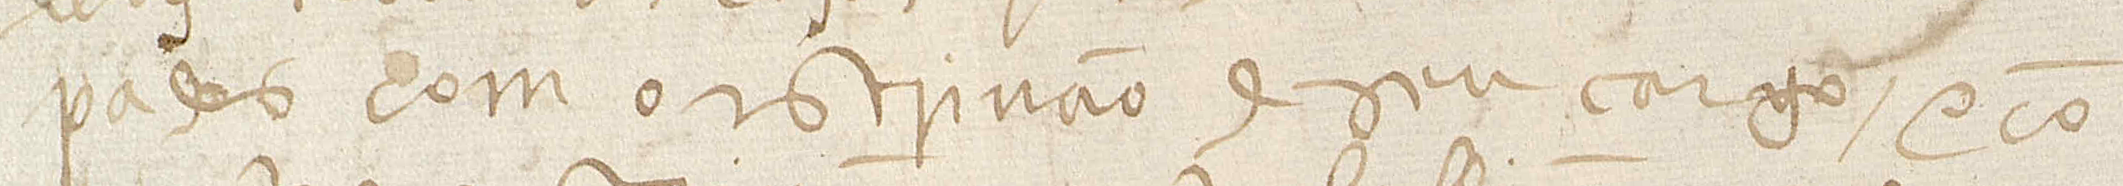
pados com o escriuão de seu cargo / e cō
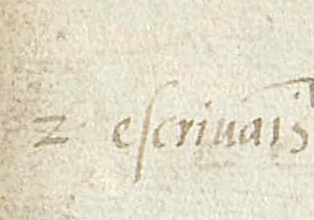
2 escriuãis
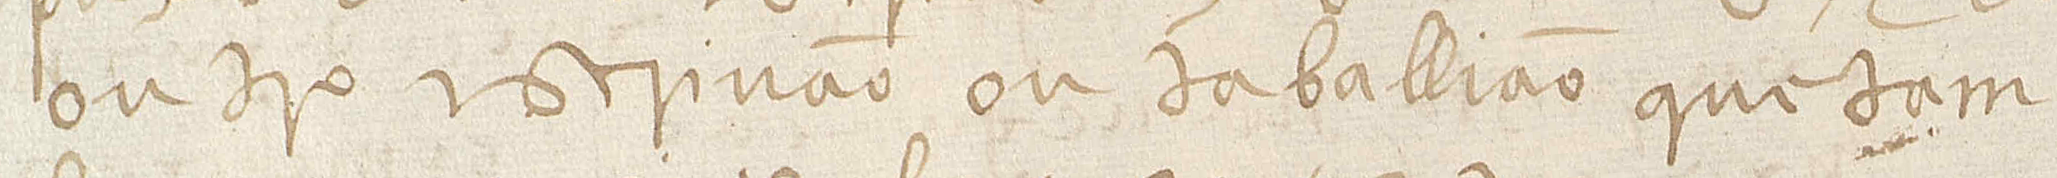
outro escriuão ou taballiaõ que tam
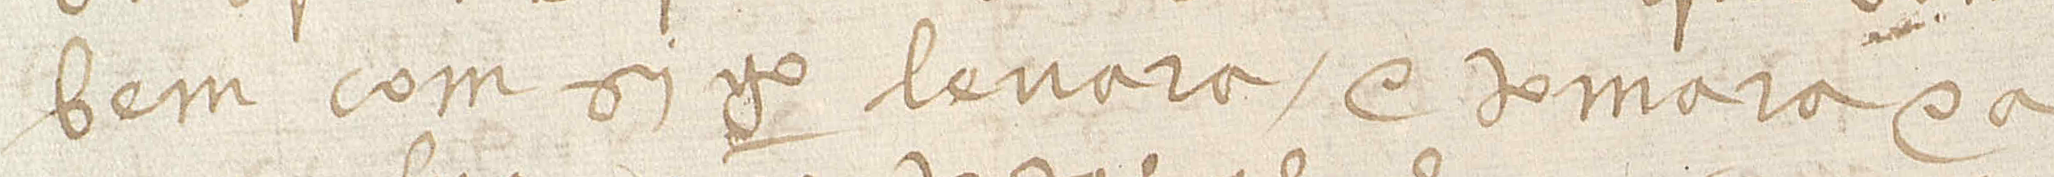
bem comsygo leuara / e tomara e a
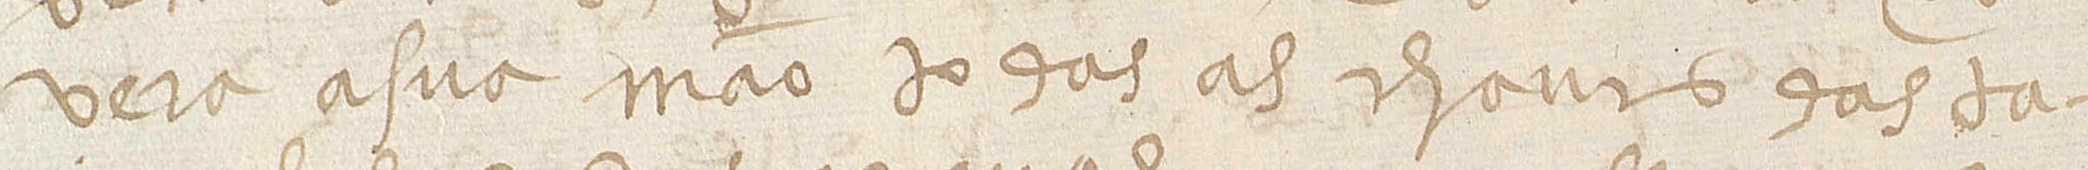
vera a sua mão todas as chaues das ta
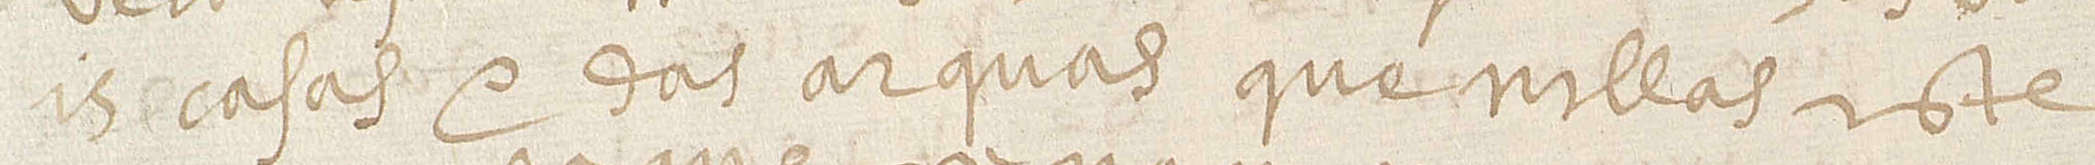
is casas e das arquas que nellas este
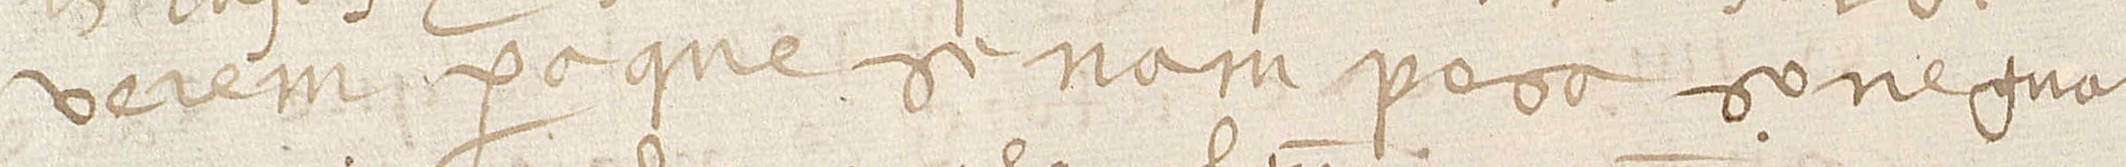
verem ꝑa que se nam posa soneguar
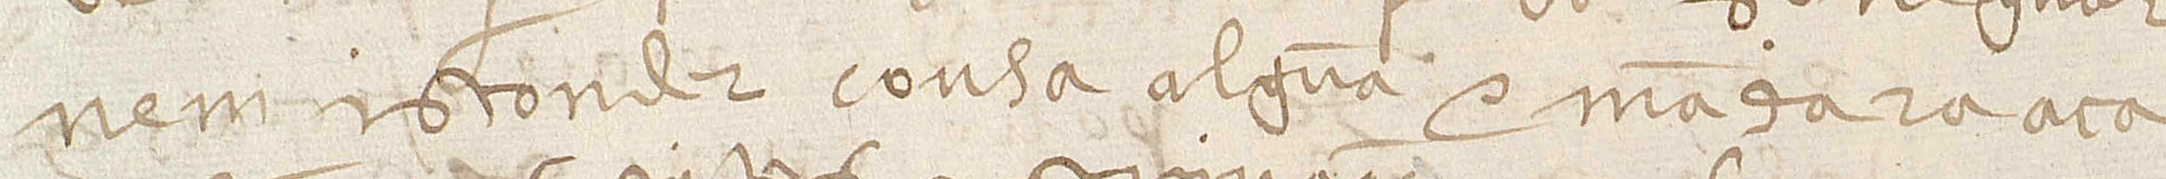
nem esconder cousa algūa e mādara a ca
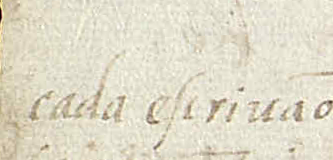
cada escriuão
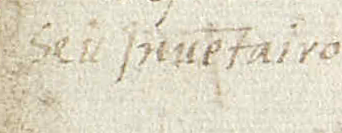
seu Jnuētairo
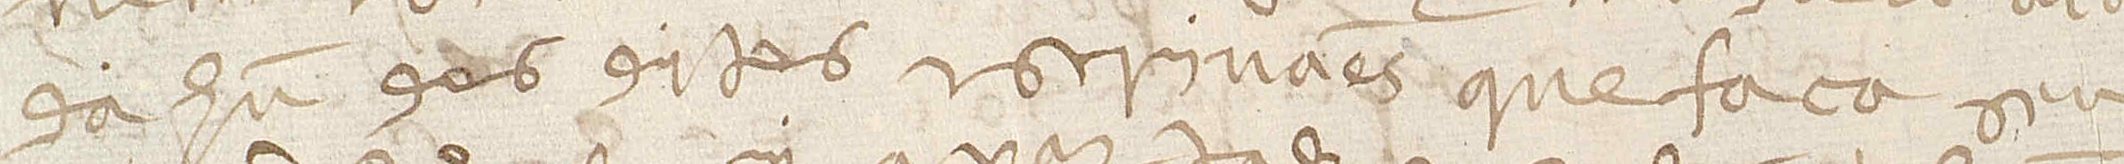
da hū dos ditos escryuaẽs que faça seu
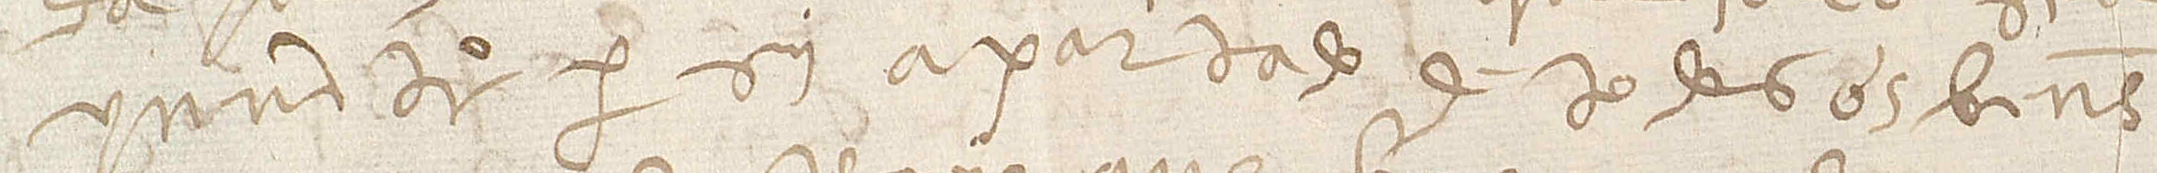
ynuētro ꝑ sy apartado de todos os ben̄s
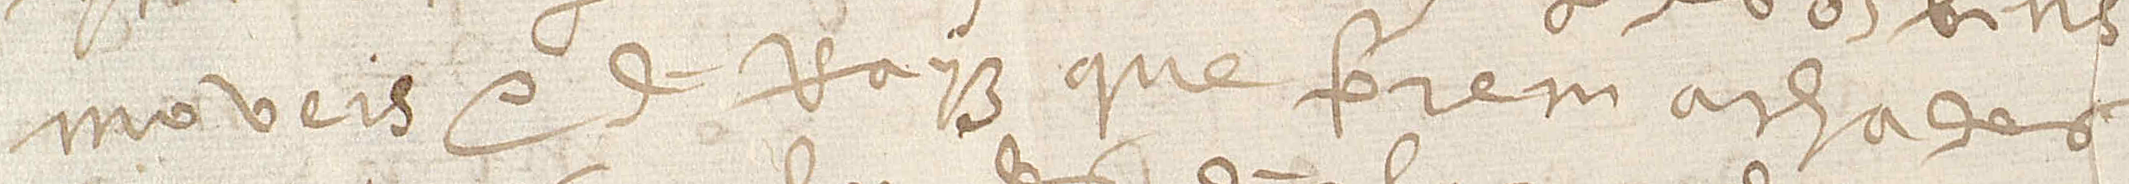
moveis e de Rays que forem achados
